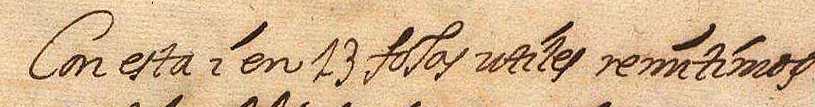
Con esta i en 13 fojas utiles remitimos
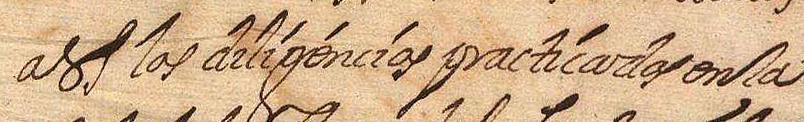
a VS las diligencias practicadas en la
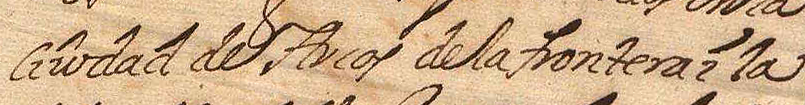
Ciudad de Arcos de la frontera i la
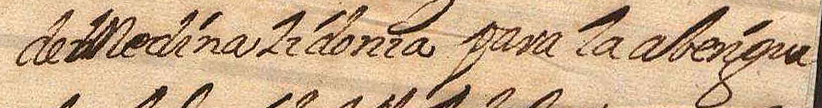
de Medina Sidonia para la aberigua
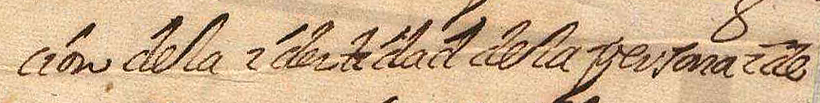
cion de la identidad de la persona i de
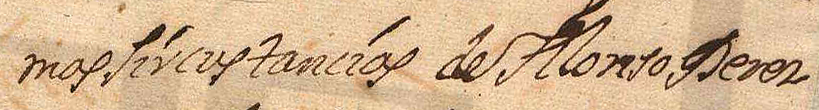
mas sircustancias de Alonso Perez
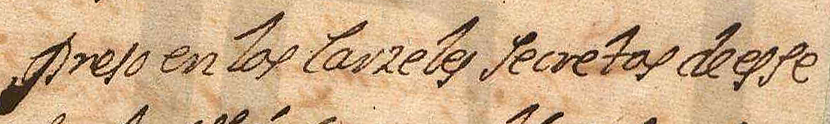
preso en las Carzeles secretas de esse
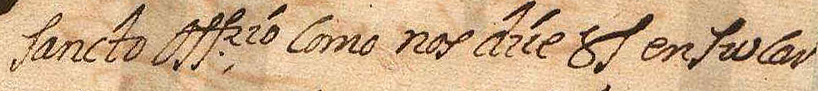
Sancto Offsio como nos dice VS en su car
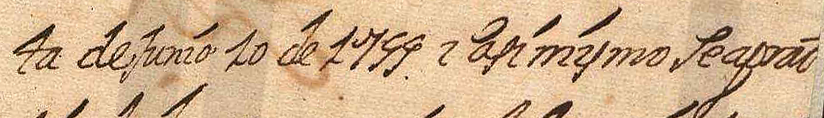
ta de Junio 10 de 1755 i asi mismo se a prac
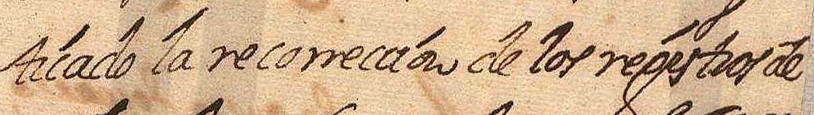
ticado la recorreccion de los registros de
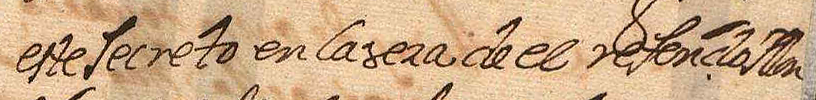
este Secreto en caveza de el referido Alon
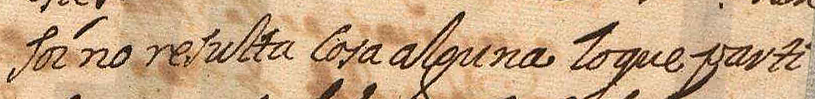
so i no resulta cosa alguna lo que parti
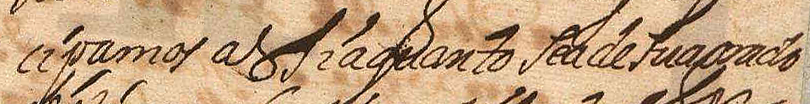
cipamos a VS i a quanto sea de su agrado
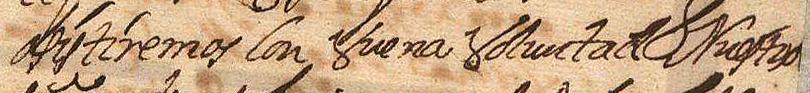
asistiremos con Vuena Voluntad Nuestro
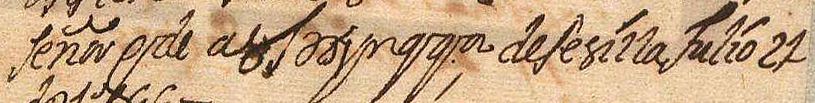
Señor gde a VS & Ynqq.on de Sevilla Julio 21
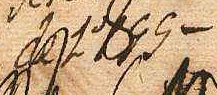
de 1755
